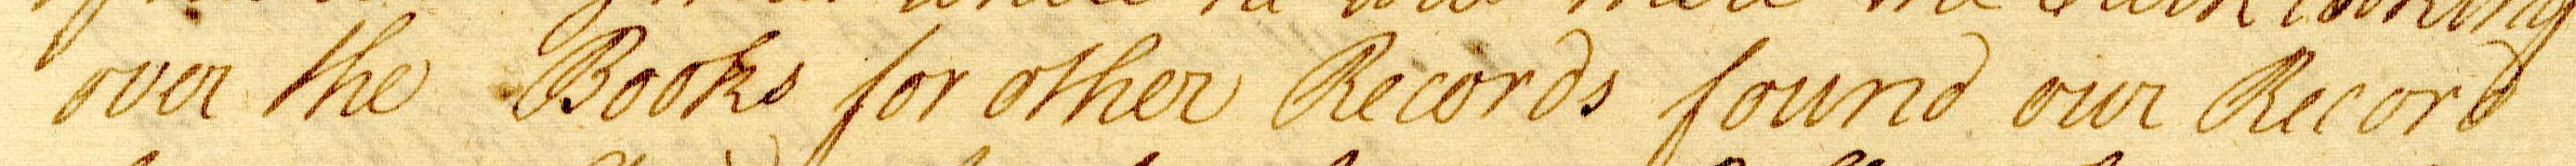over the Books for other Records found our Record
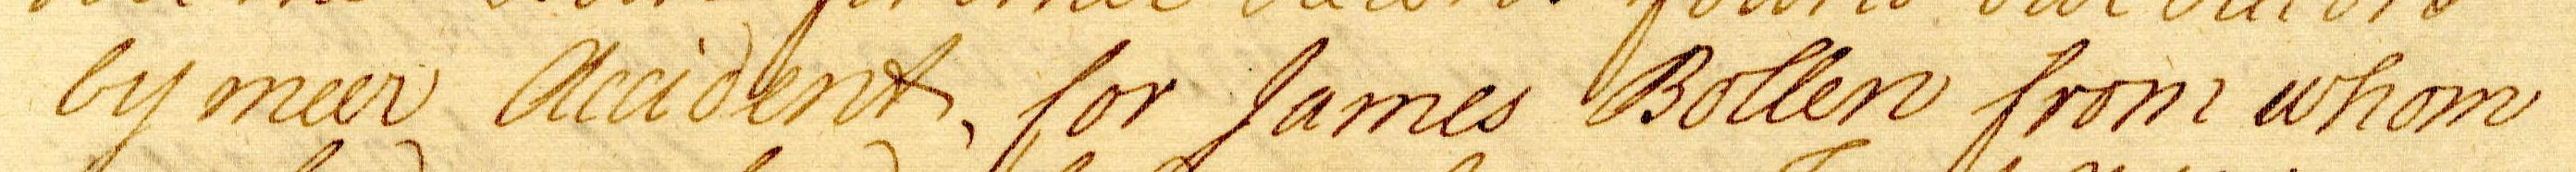by meer Accident, for James Bollen from whom
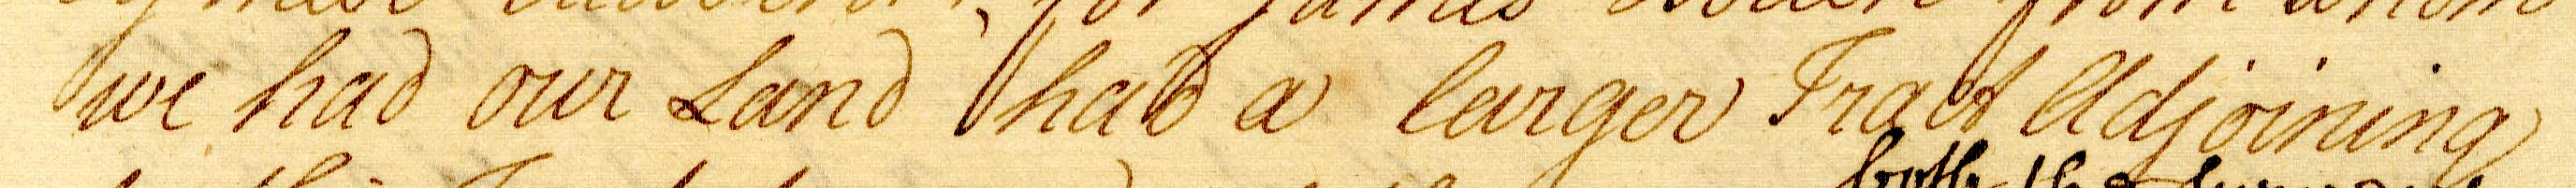we had our Land had a larger Tract Adjoining
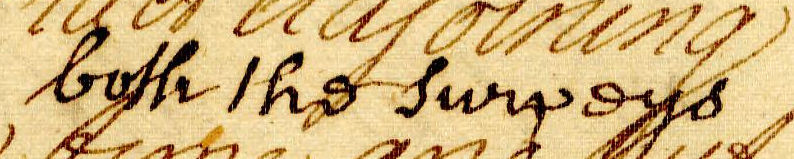both the surveys
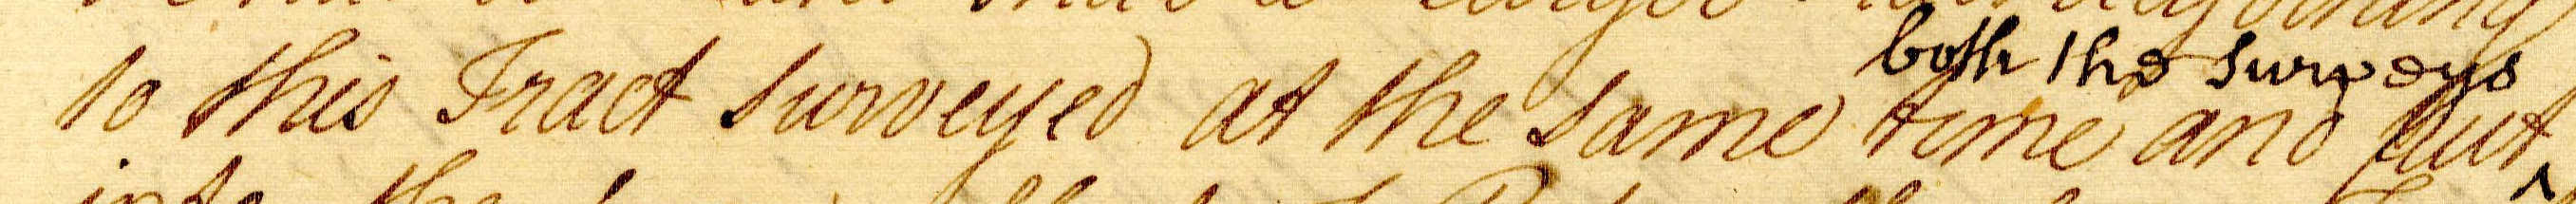to this Tract surveyed at the Same time and out^
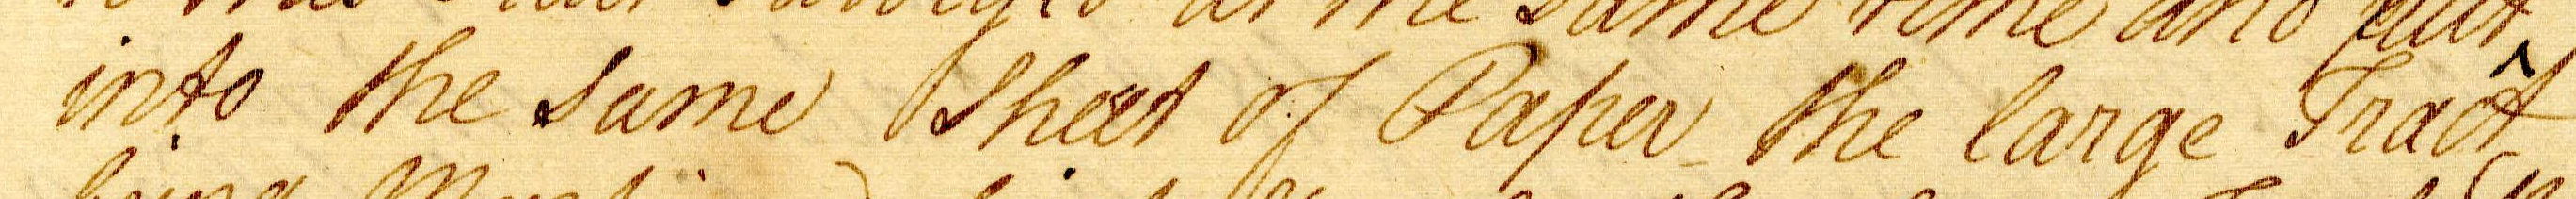into the Same Sheet of Paper the large Tract
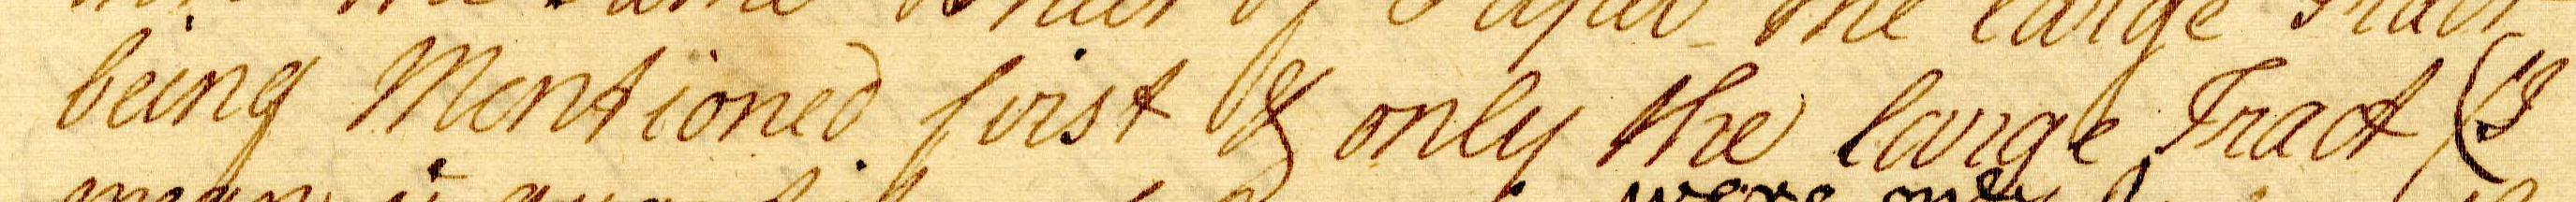being Mentioned first & only the Large Tract (I
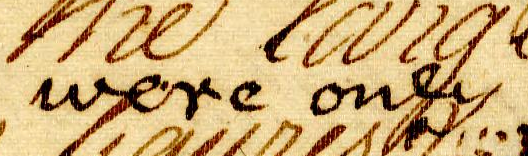were only
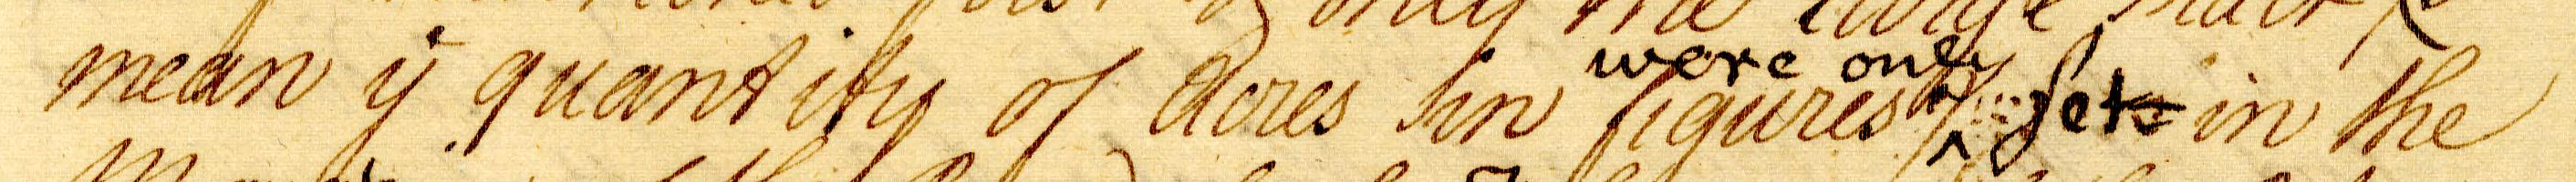mean y^e quantity of Acres in ^ figures) Set in the
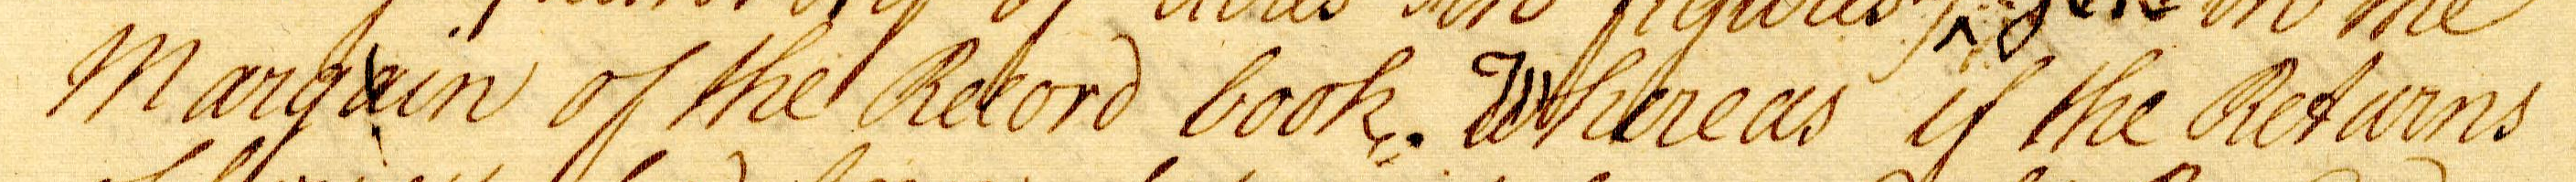Margin of the Record book. Whereas if the Returns
